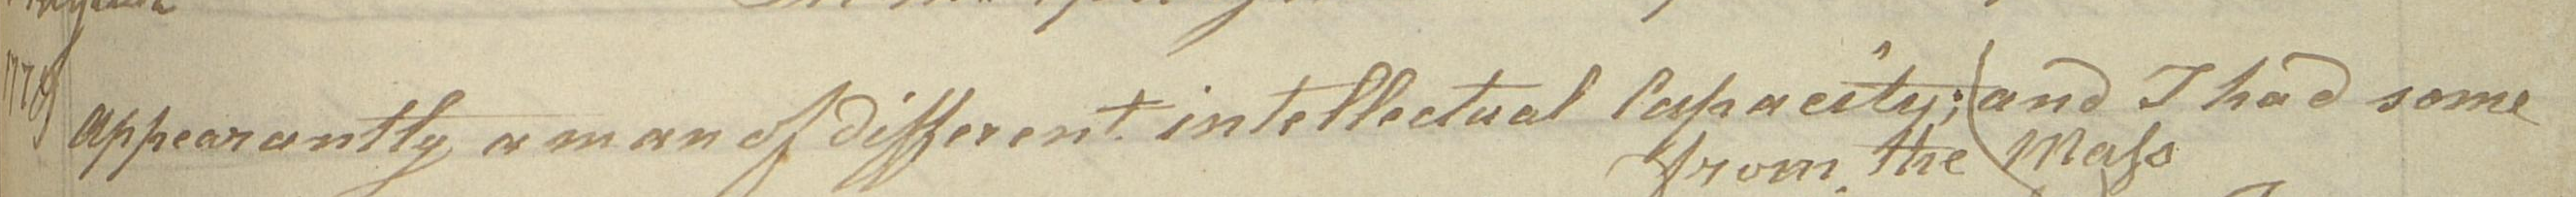Appearantly a man of different intellectual Capacity; (and I had some
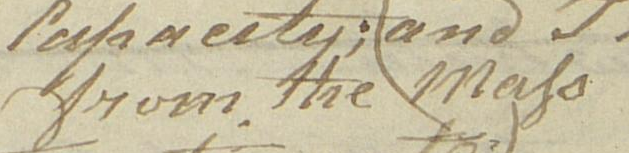from the Mass
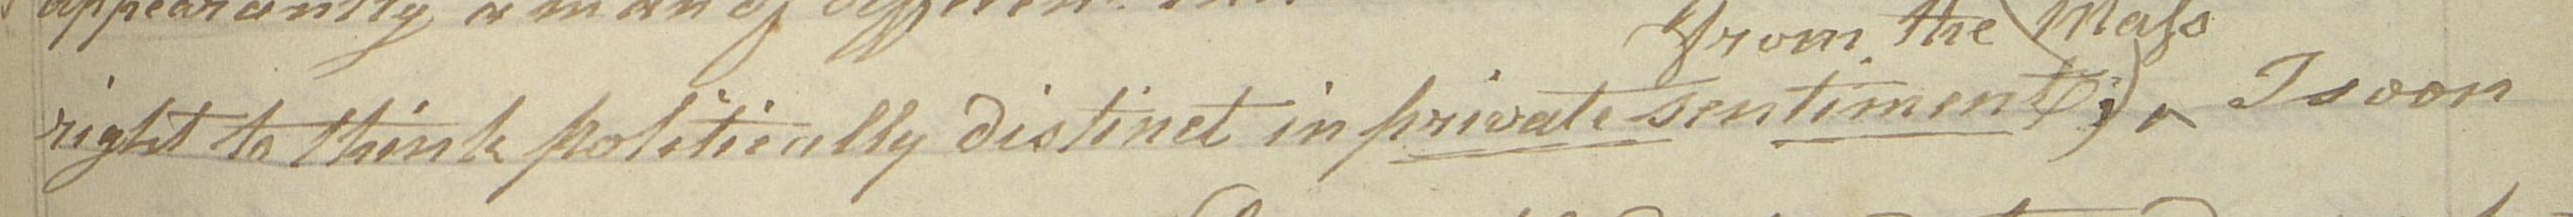right to think politically distinct in private sentiment, ^ I soon
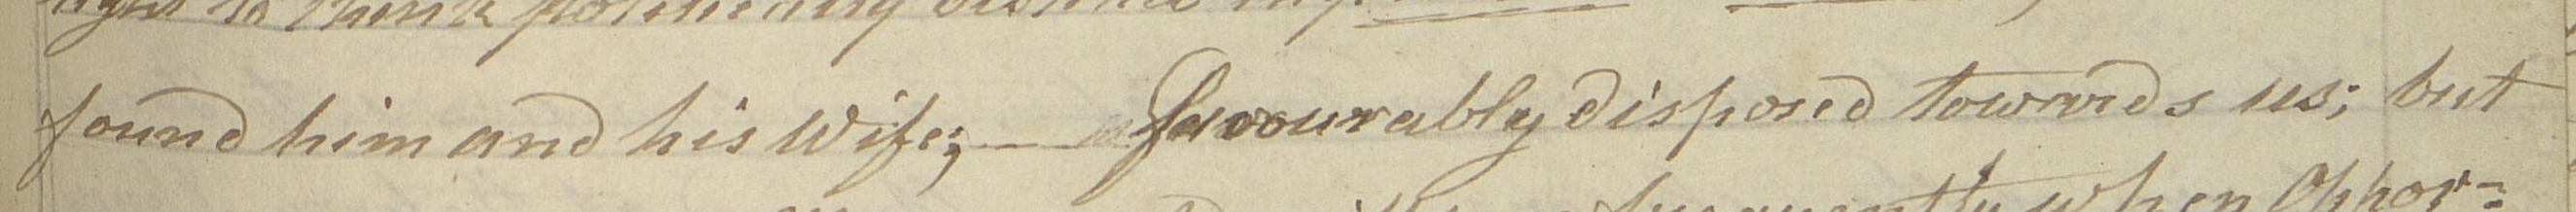found him and his Wife; favourably disposed towards us; but
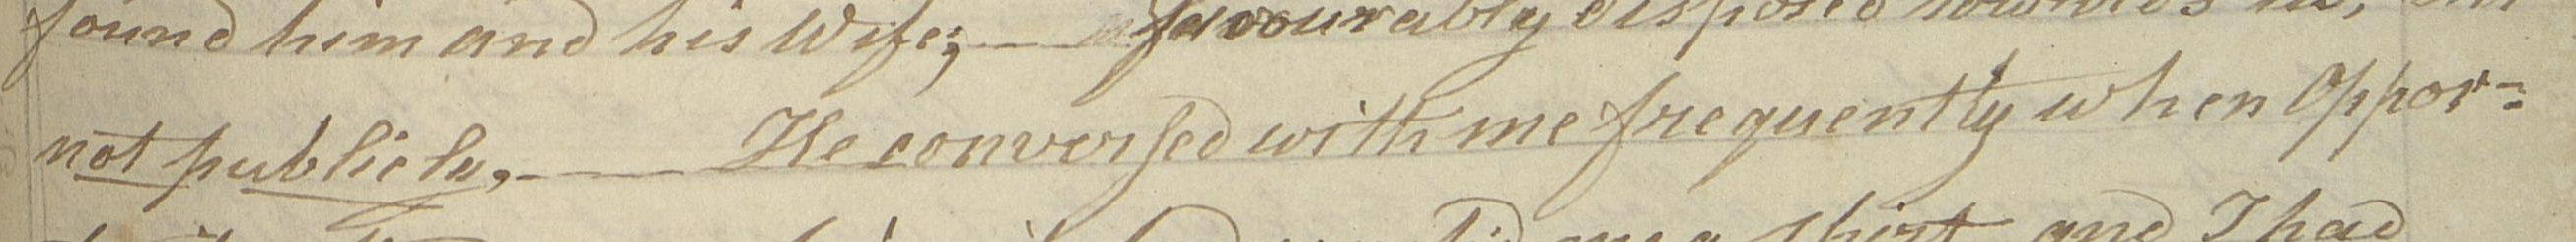not publicly, He conversed with me frequently when Oppor-
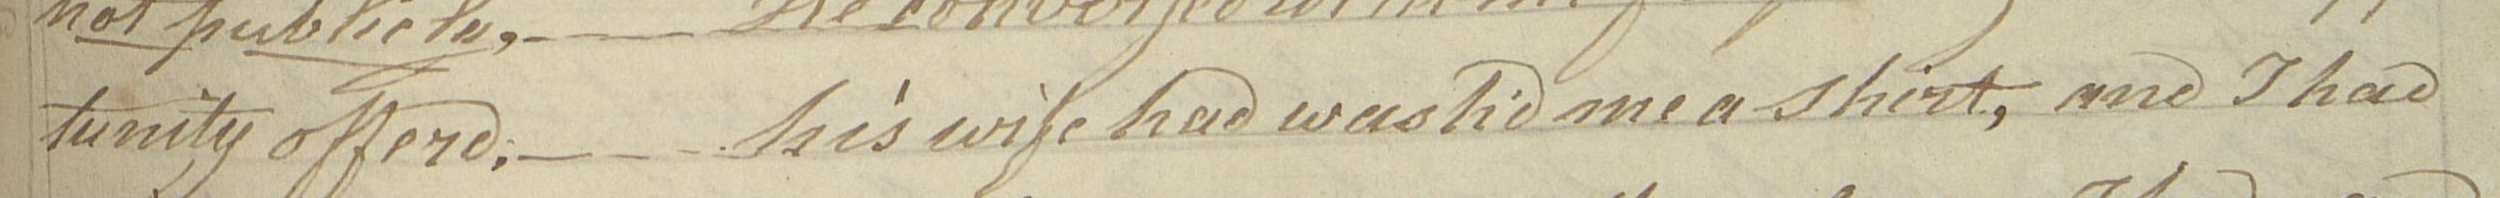-tunity offerd. his wife had wash'd me a shirt, and I had
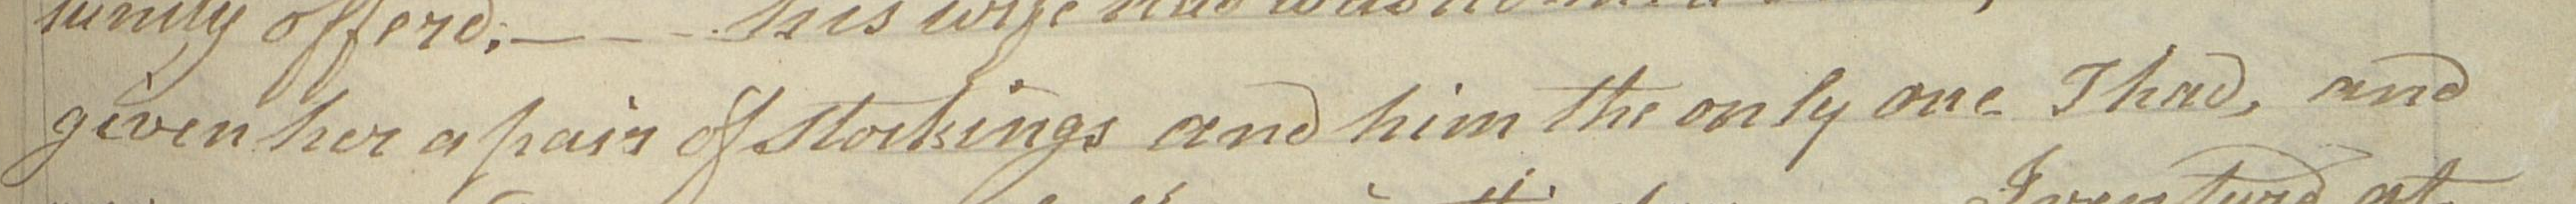given her a pair of stockings and him the only one I had, and
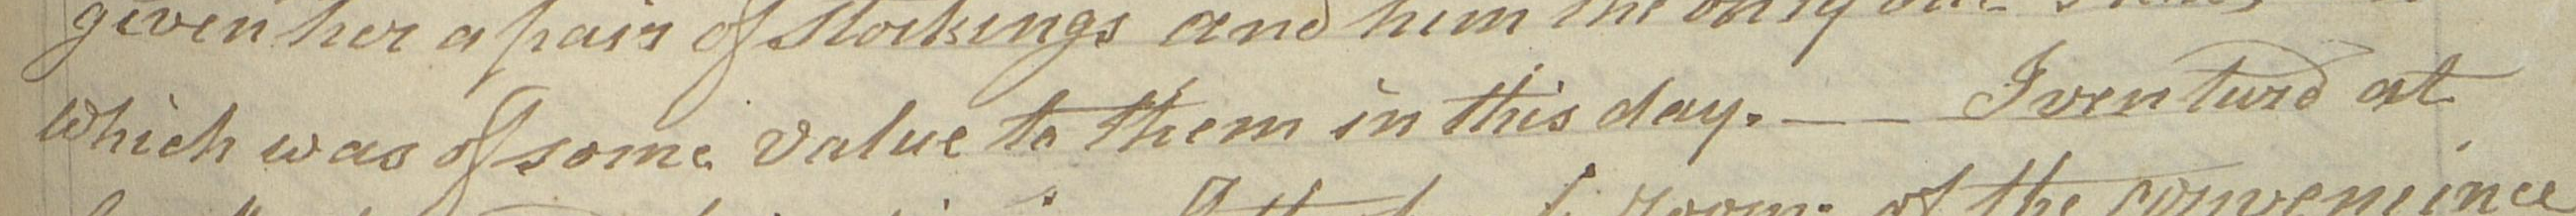which was of some value to them in this day. I venturd at
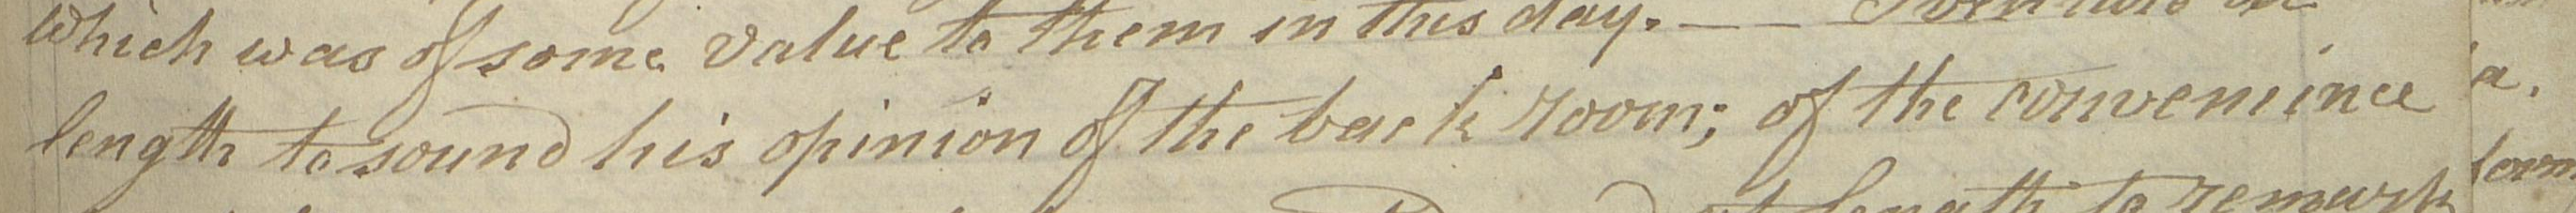length to sound his opinion of the back room; of the convenience a
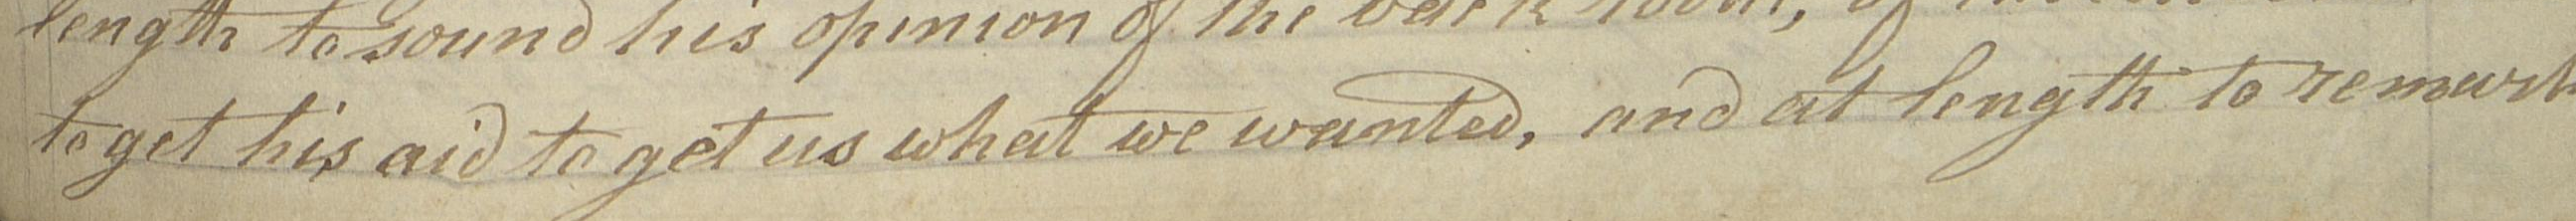to get his aid to get us what we wanted, and at length to remark
